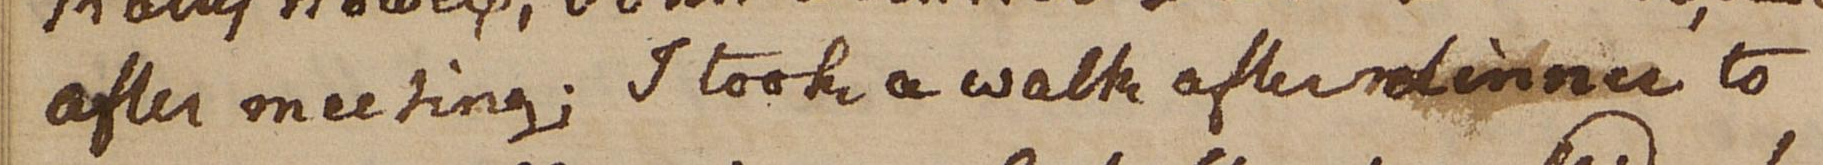after meeting; I took a walk after dinner to
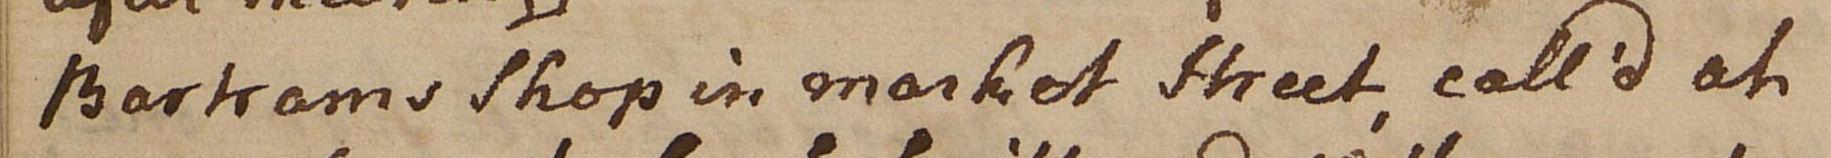Bartrams shop in market Street, call'd at
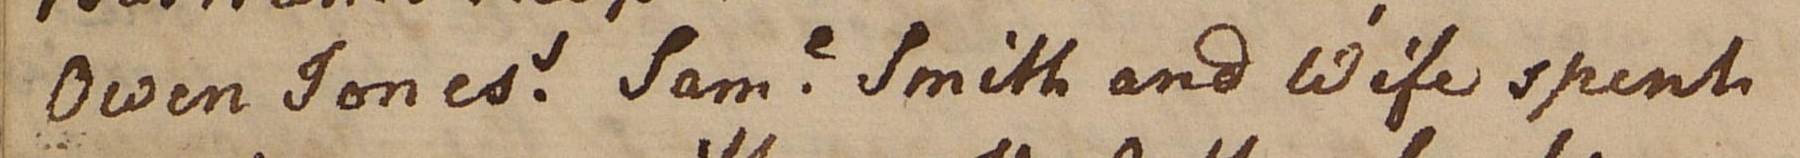Owen Jones^s. Sam^l. Smith and wife spent
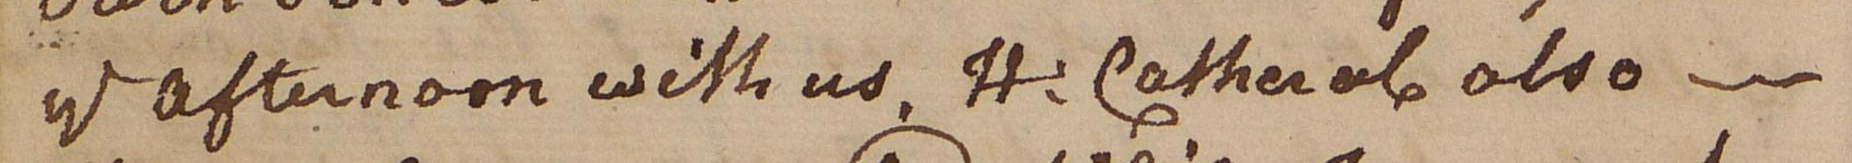y^e afternoon with us, H: Catheral also-
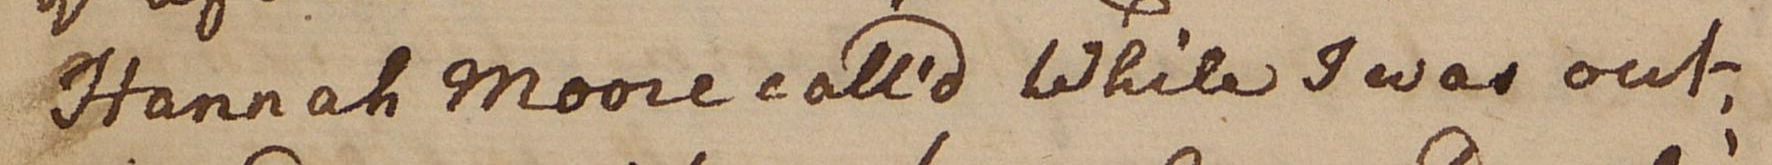Hannah Moore call'd While I was out,
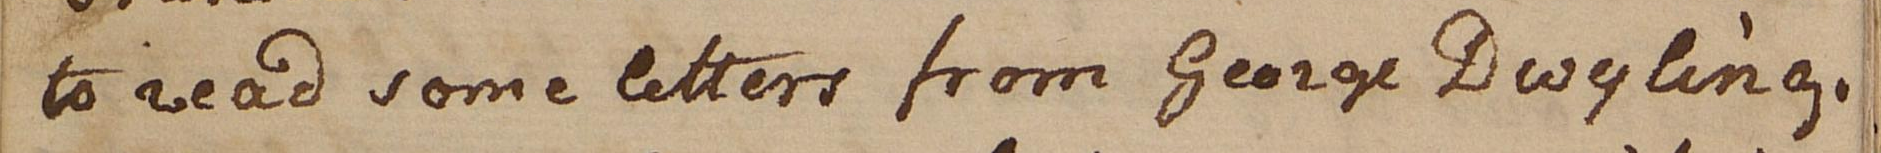to read some letters from George Dwyling.
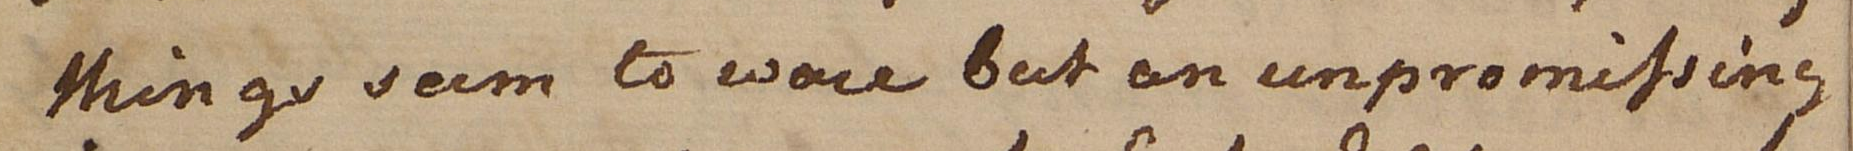things seem to ware but an unpromissing
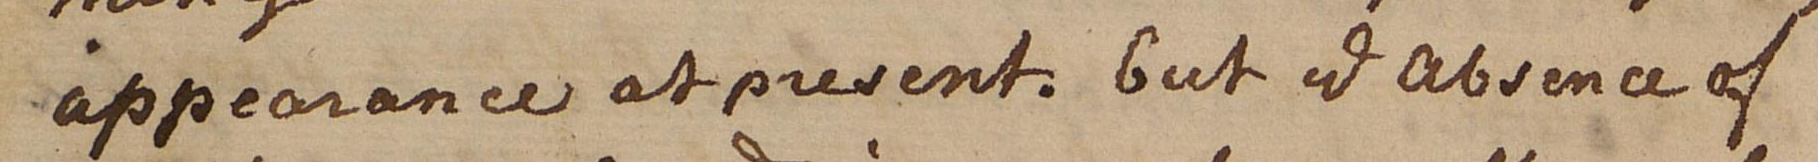appearance at present. but y^e absence of
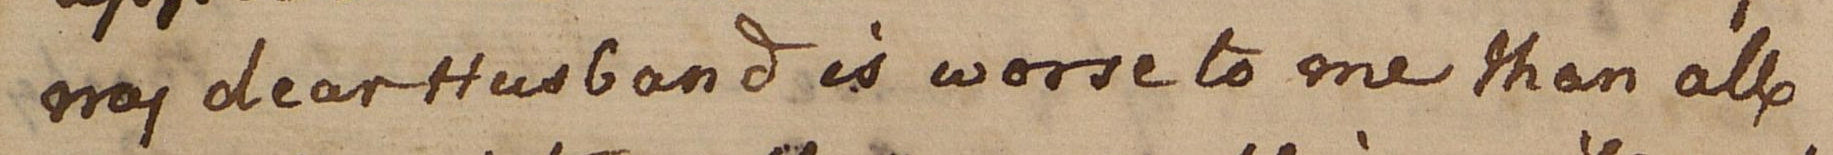my dear Husband is worse to me than all
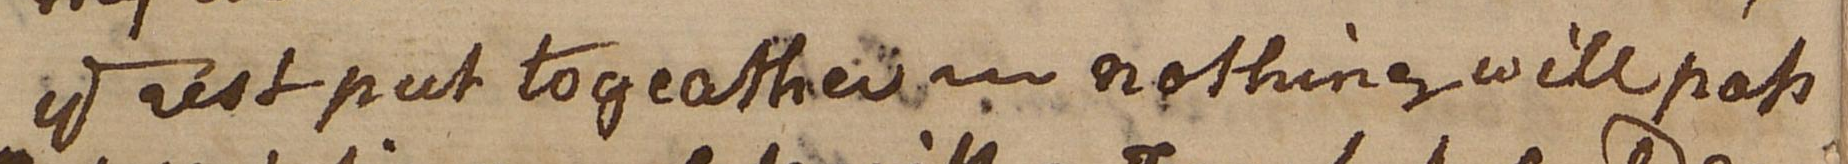y^e rest put togeather - nothing will pass
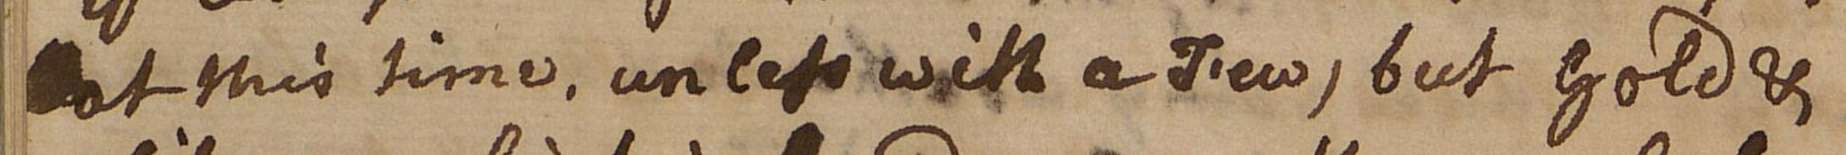at this time, unless with a Jew, but Gold &
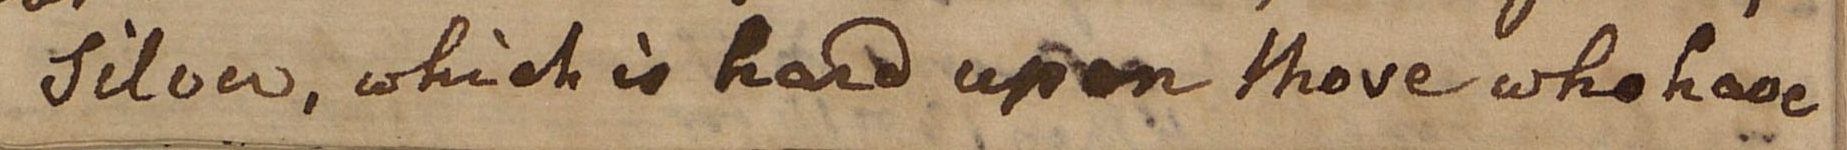Silver, which is hard upon those who have
